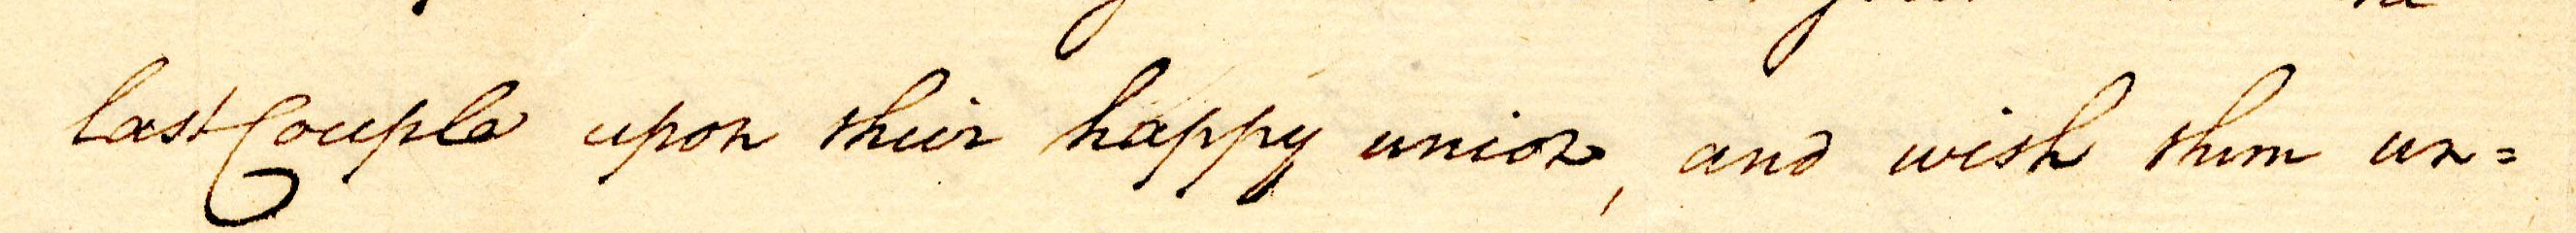last Couple upon their happy union, and wish them un-
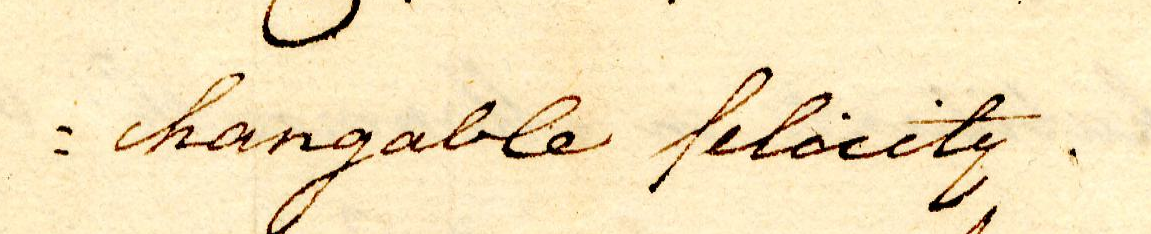-changable felicity.
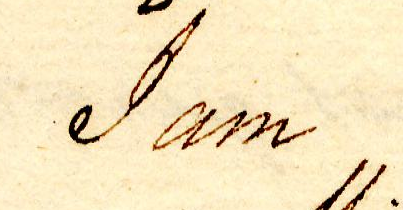I am
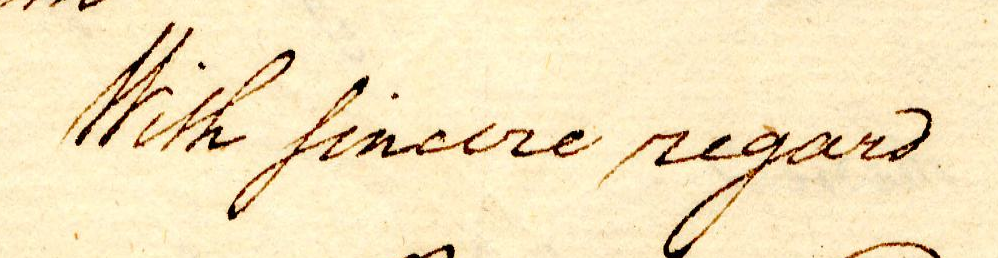with sincere regard
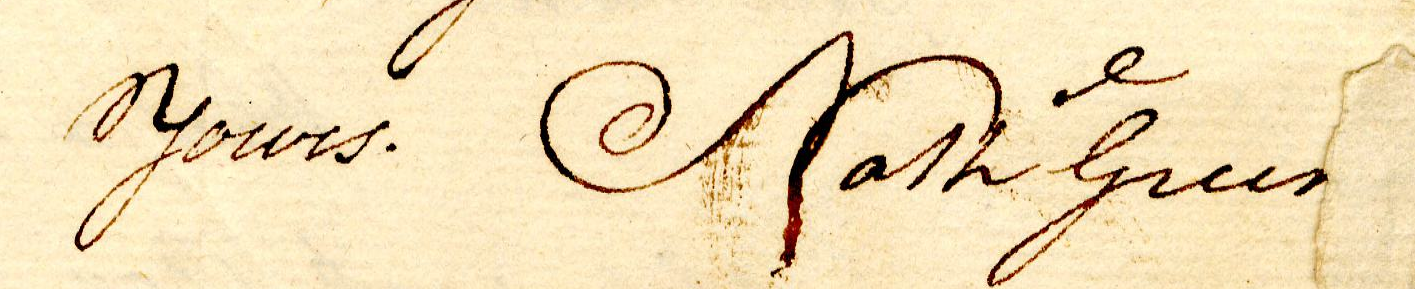Yours. Nath^l Green
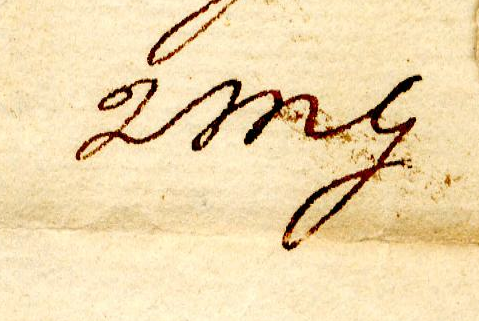QMG
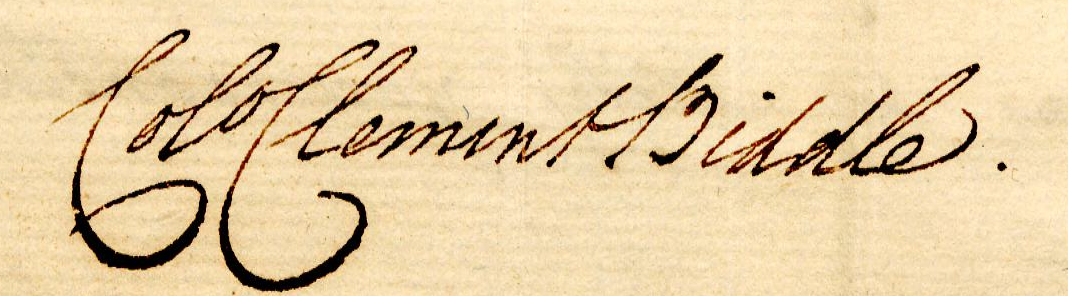Colo Clement Biddle.
